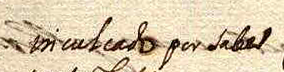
inculcado por saber
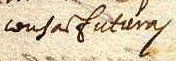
cousas futuras
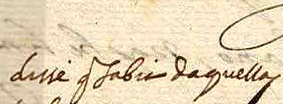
disse q̄ sabia daquellas
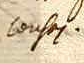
cousas.
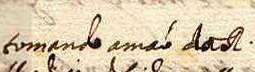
tomando a maõ da R.
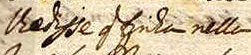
lhe disse q̄ tinha nella
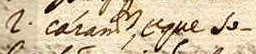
2. cazam.tos, e que so
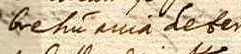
bre hū auia de ter
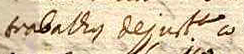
trabalhos de just.a co
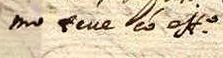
mo teue cō eff.o
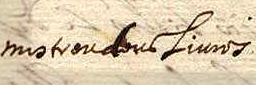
mostrou dous Liuros
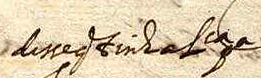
disse q̄ tinha Lca pa
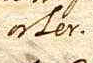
os Ler.
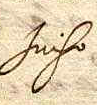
Juiso
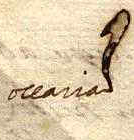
occaziaõ
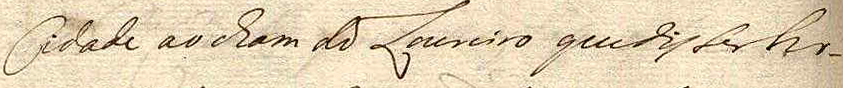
Cidade ao cham do Loureiro que dis ser ho
